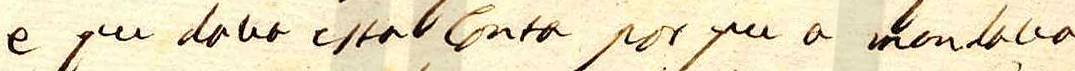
e que dava esta Conta por que a mandava
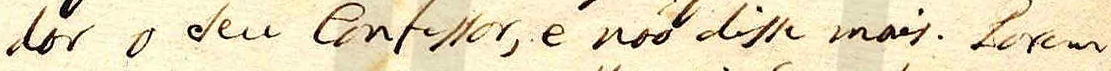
dar o seu Confessor, e não disse mais. Porem
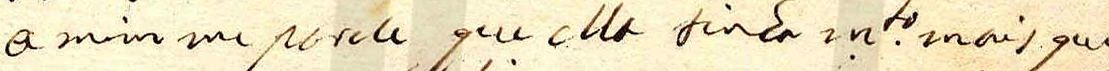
a mim me parece que ella tinha m.to mais que
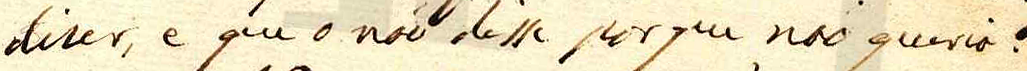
dizer, e que o naõ disse porque naõ queria.
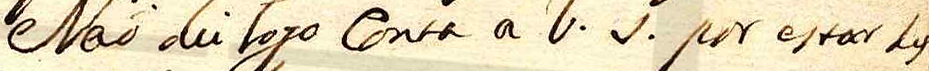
Naõ dei Logo Conta a V. s. por estar des
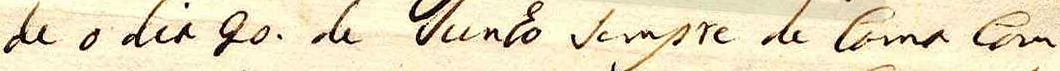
de o dia 20. de Iunho sempre de Cama Com
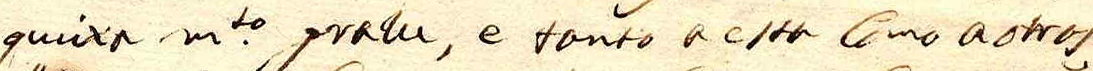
queixa m.to grave, e tanto a esta Como a otras,
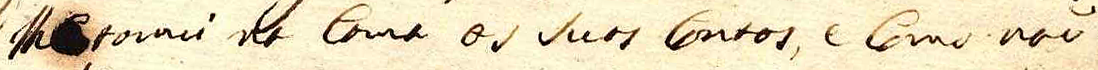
lh_ tomei na Cama as suas Contas, e Como naõ
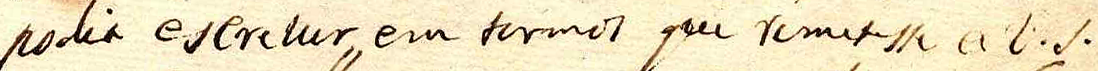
podia escrever em termos que remetesse a V. s.
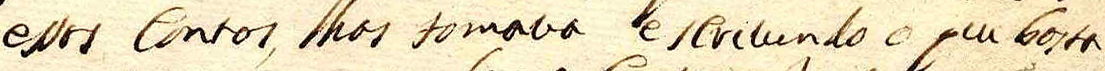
essas Contas, lhas tomava escrevendo o que basta
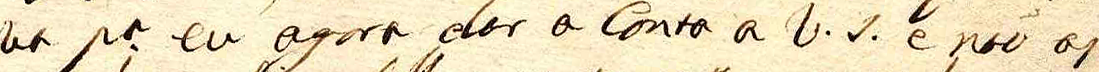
va p.a eu agora dar a Conta a V. s. e naõ as
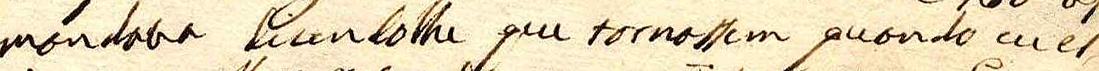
mandava dizendolhe que tornassem quando eu es
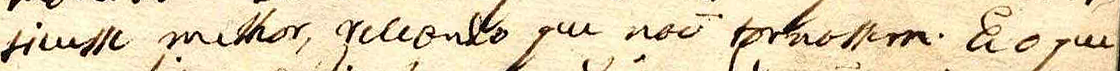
tiuesse melhor, receando que naõ tornassem. he o que
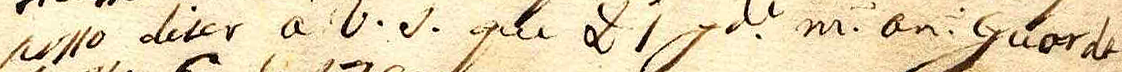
posso dizer a V. s. que Ds̄ gde. m.̄ an.̄ Guarda
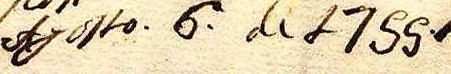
Agosto. 6. de 1755.
